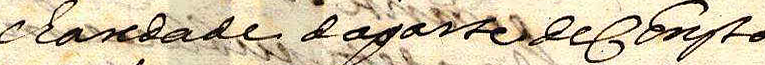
charidade da parte de Christo
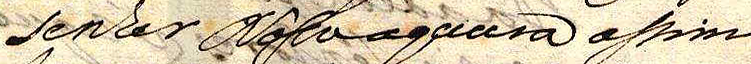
senhor Nosso a queira assim
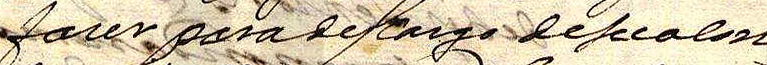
fazer para descargo de sua con
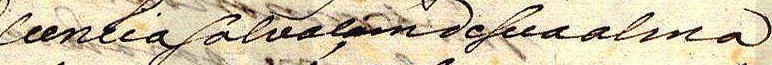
ciencia salvaçam de sua alma,
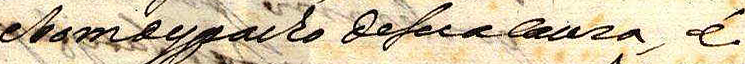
e bom despacho de sua cauza, e
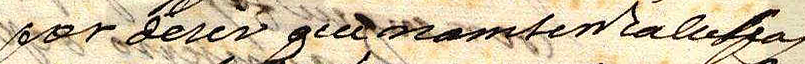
por dezer que nam tinha culpas
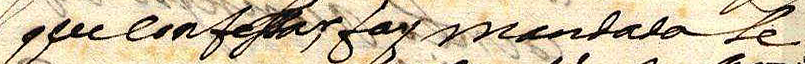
que confessar, foy mandada Le
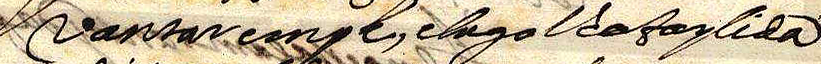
vantar em pé e logo lhe foy lida
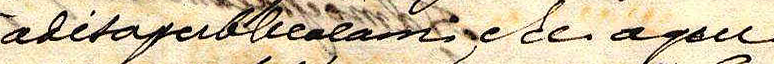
a dita publicaçam, e he a que
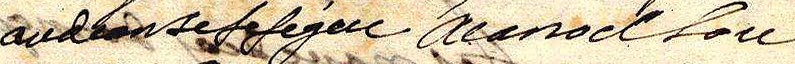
aodiante se segue Manoel Lou
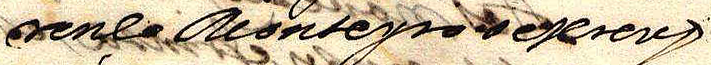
renço Monteyro o escrevy
